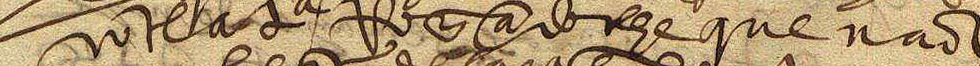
cō ella ta Rogādolhe que naõ
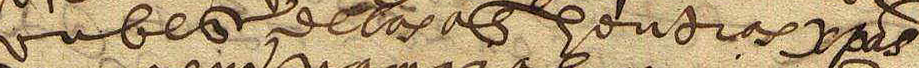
soubesē delas as houtras xpas̄
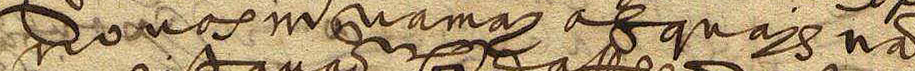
nouas nē sua maj as quajs naõ
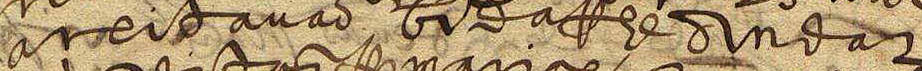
açeitauaõ bē da Rhe Andar
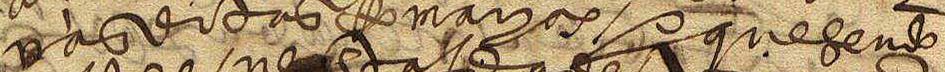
nas ditas Romarjas / e que sendo
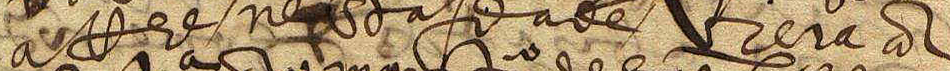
a Rhe / nesta Jdade / viera cō
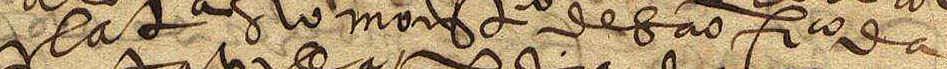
ela ta Ao moestro de são frco da
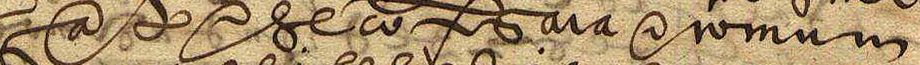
sāto e se cōfesara e comum
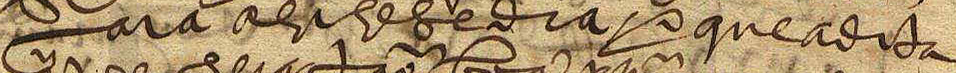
gara ahi hese dia / e que a dita
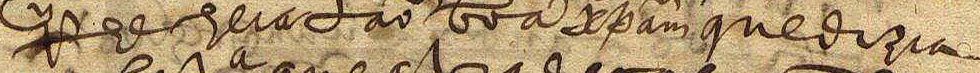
Rhe hera taõ boa xpām que dizia
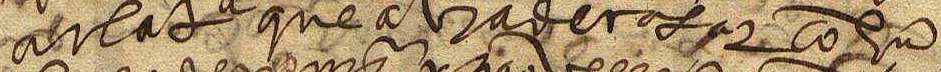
a ela ta que avja de casar cō hū
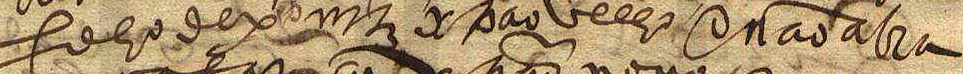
filho de ꝑo miz̄ xpão velho / e não avia
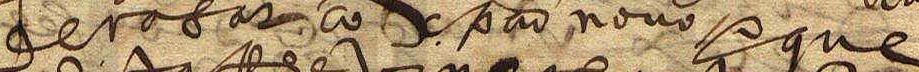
de casar cō xpão nouo / e que
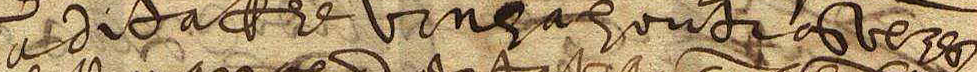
a dita Rhe Vinha houtras vezes
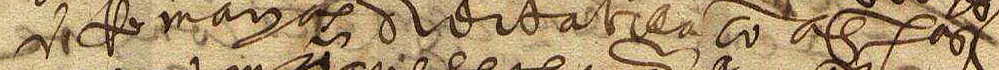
ē Romarjas A dita villa cō as fas
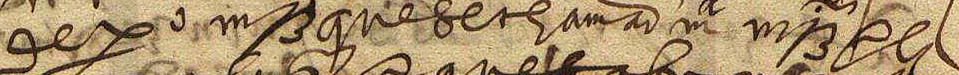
de ꝑo mjz̄ que se chamão ma mjz̄ e lj
